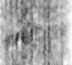一
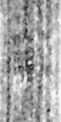才（在）
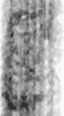{匚去}
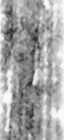{阝咸}
